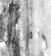敔
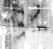之
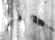八
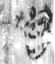檐（擔）
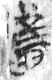○（巂）
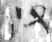四
